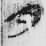月
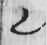乙
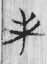未
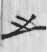之
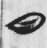日
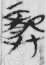龔
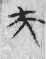夫
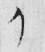人
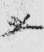之
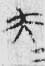大夫
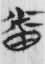番
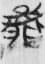○（嬴）
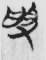受
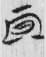○（期）
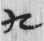九
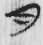月
